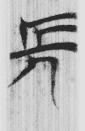長
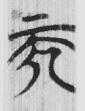而
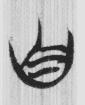自
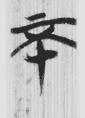不
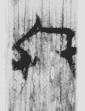夂
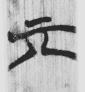亓
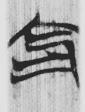命
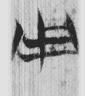用
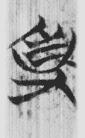事
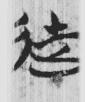徒
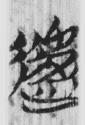遽
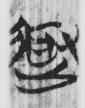{辶取}
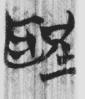聖
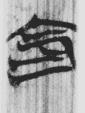命
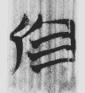於
